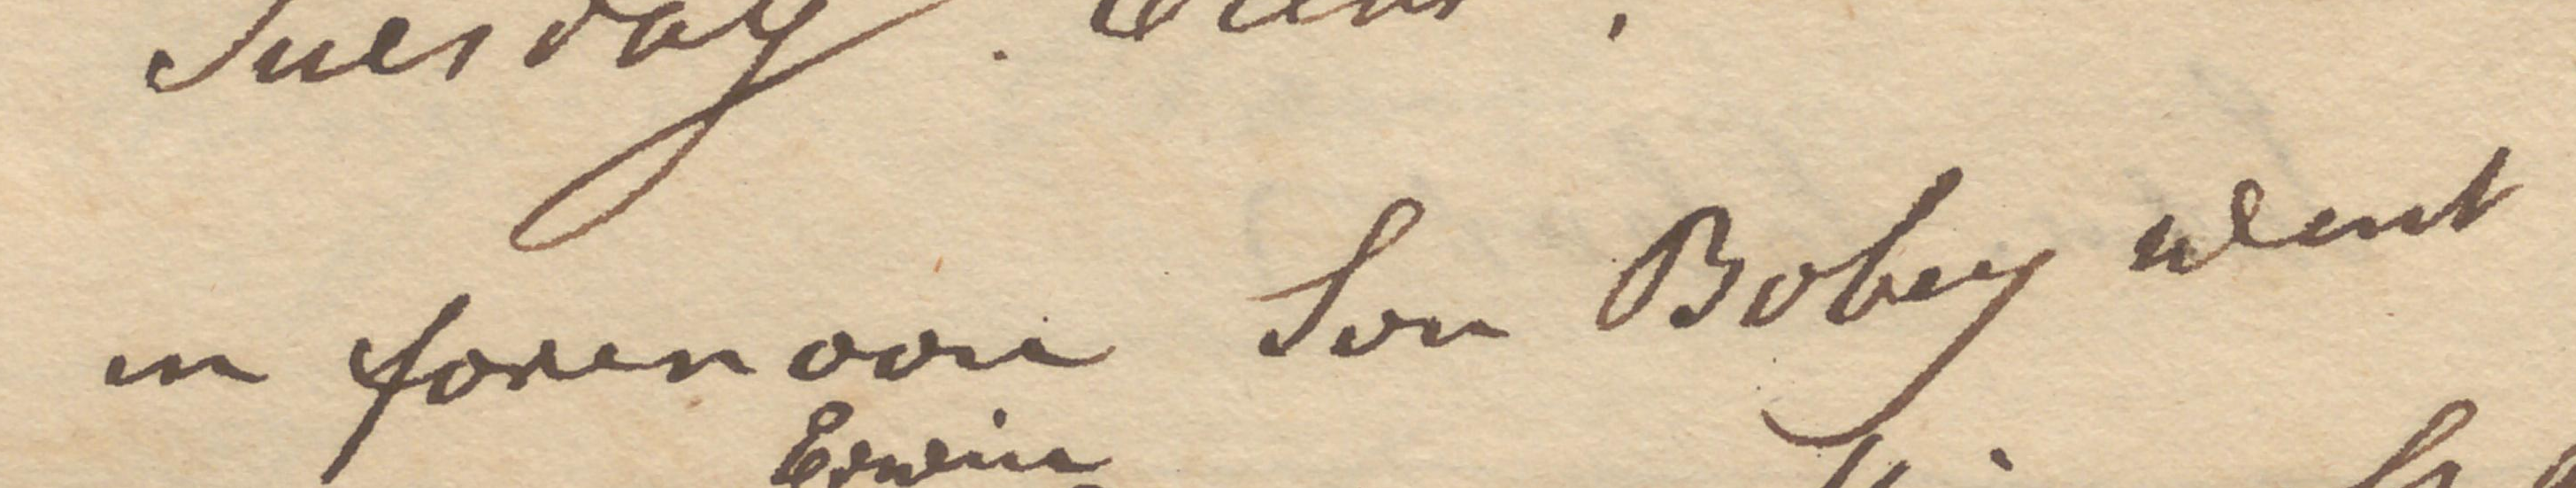in forenoon Son Bobey went
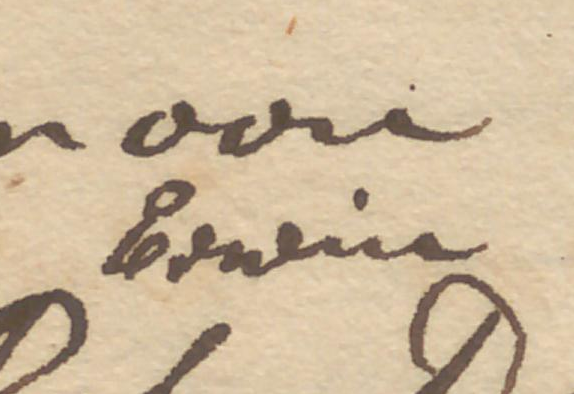Erwin
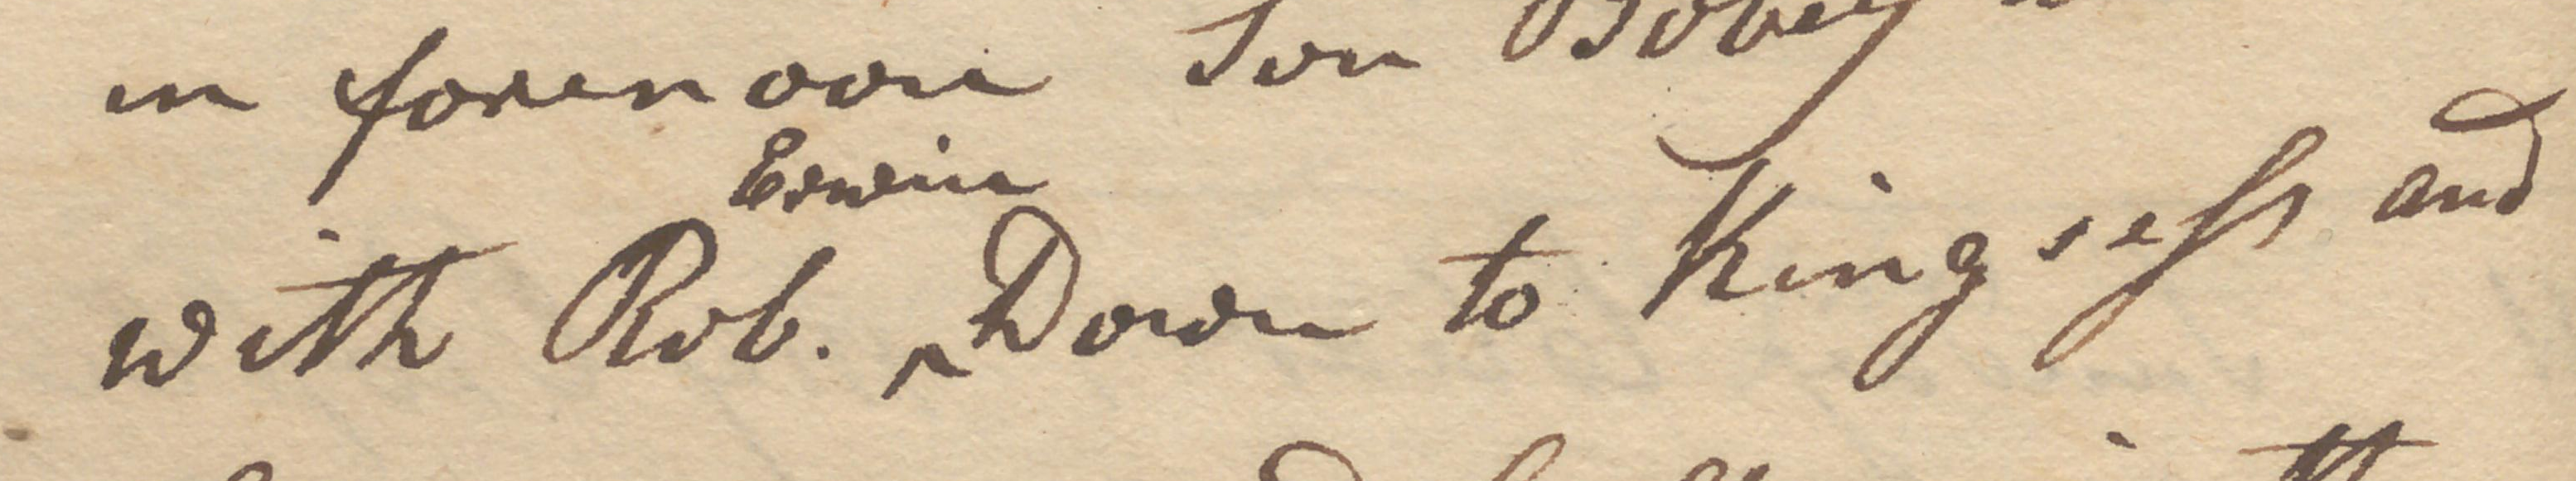with Rob. ^ Down to Kingsess am
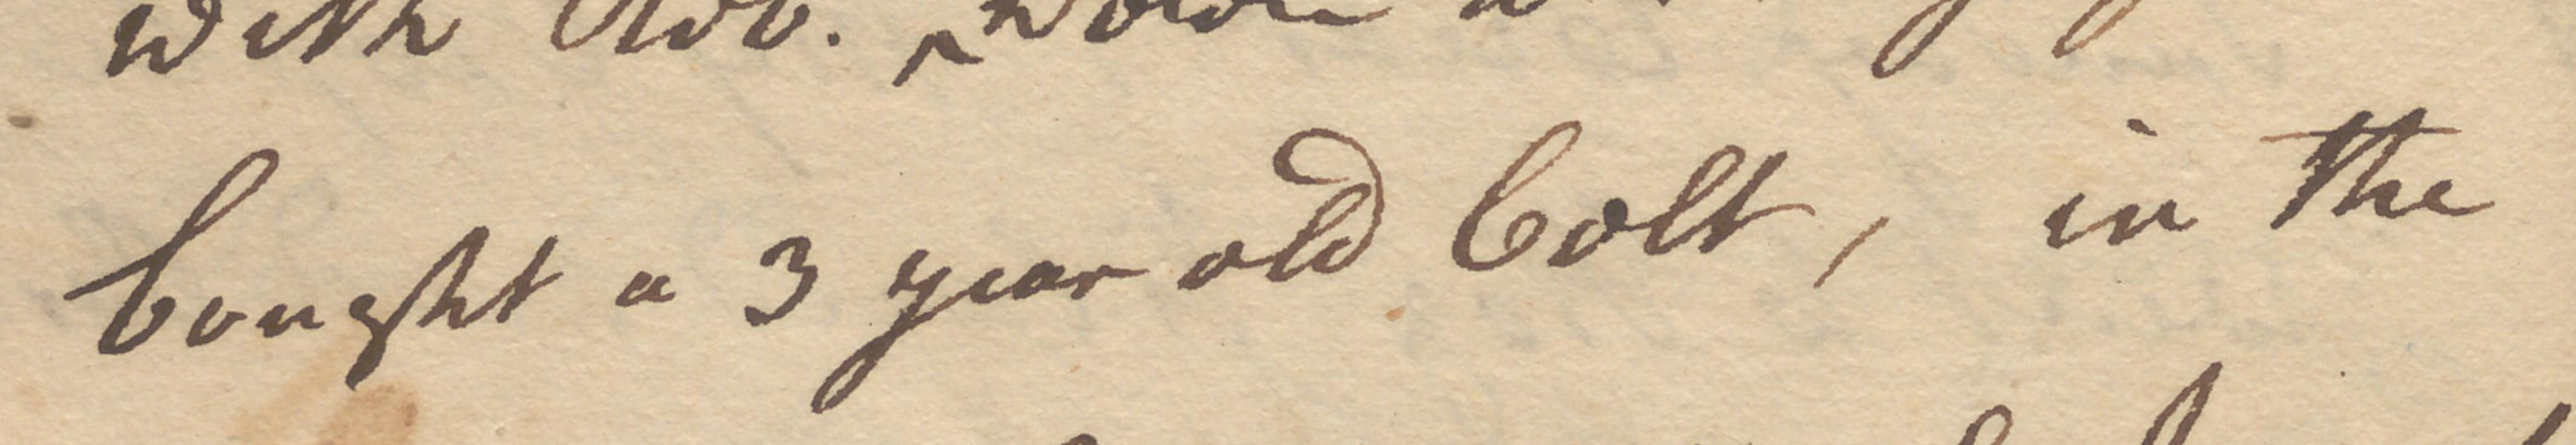bought a 3 year old Colt, in the
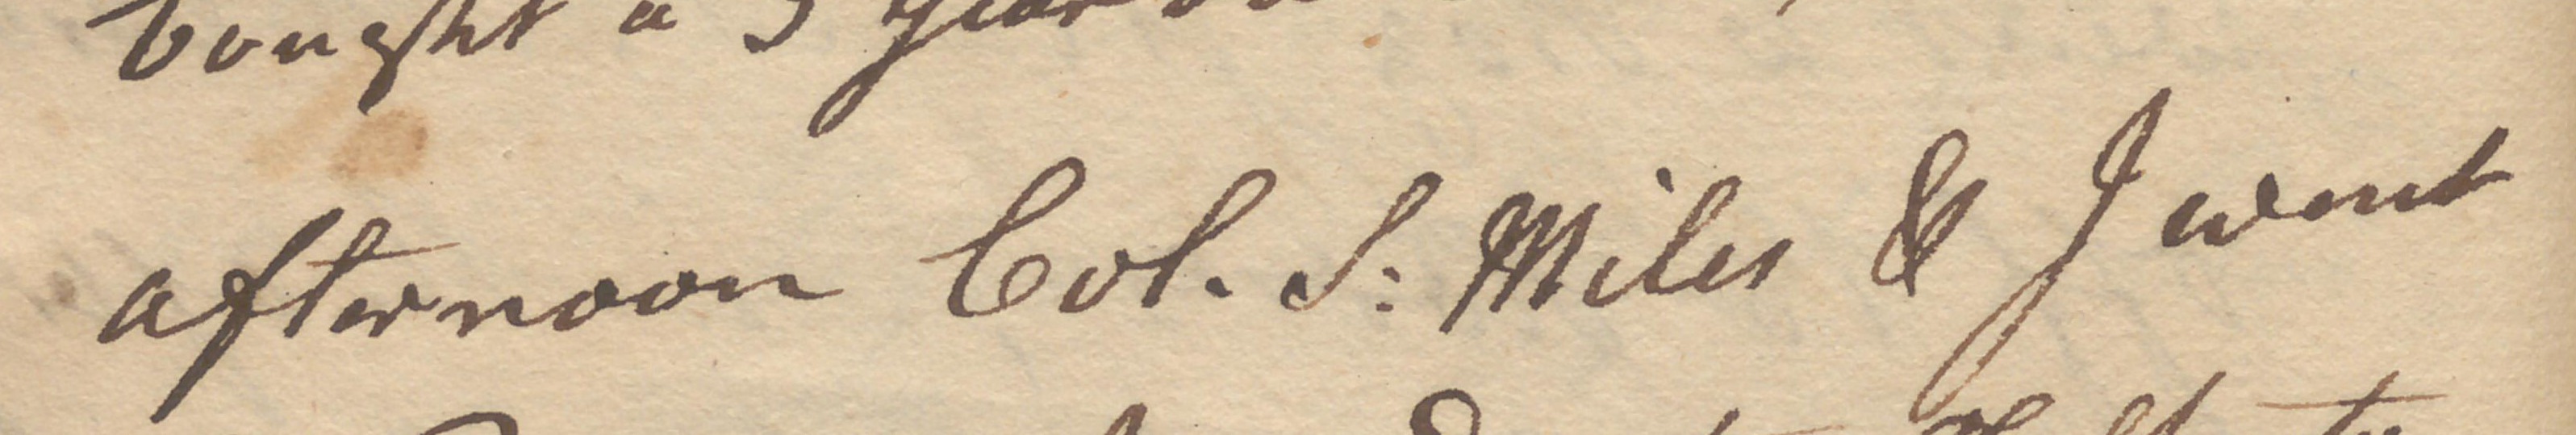afternoon Col. S: Miles & I went
